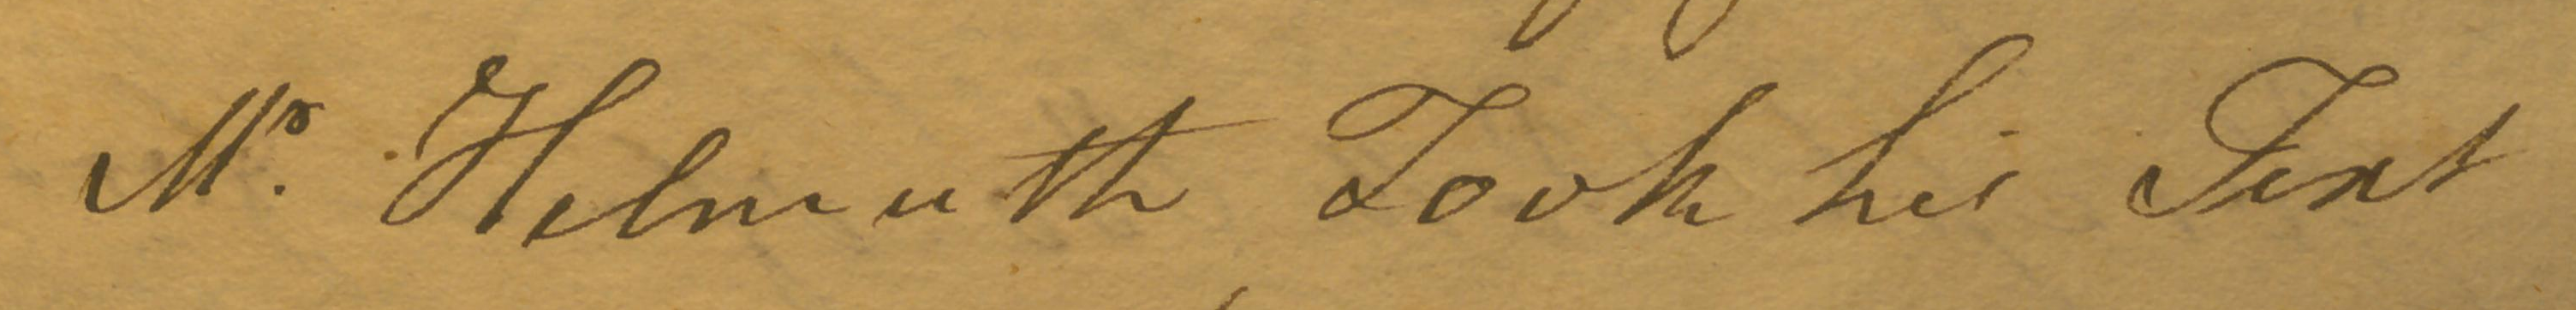M^r. Helmuth Took his Text
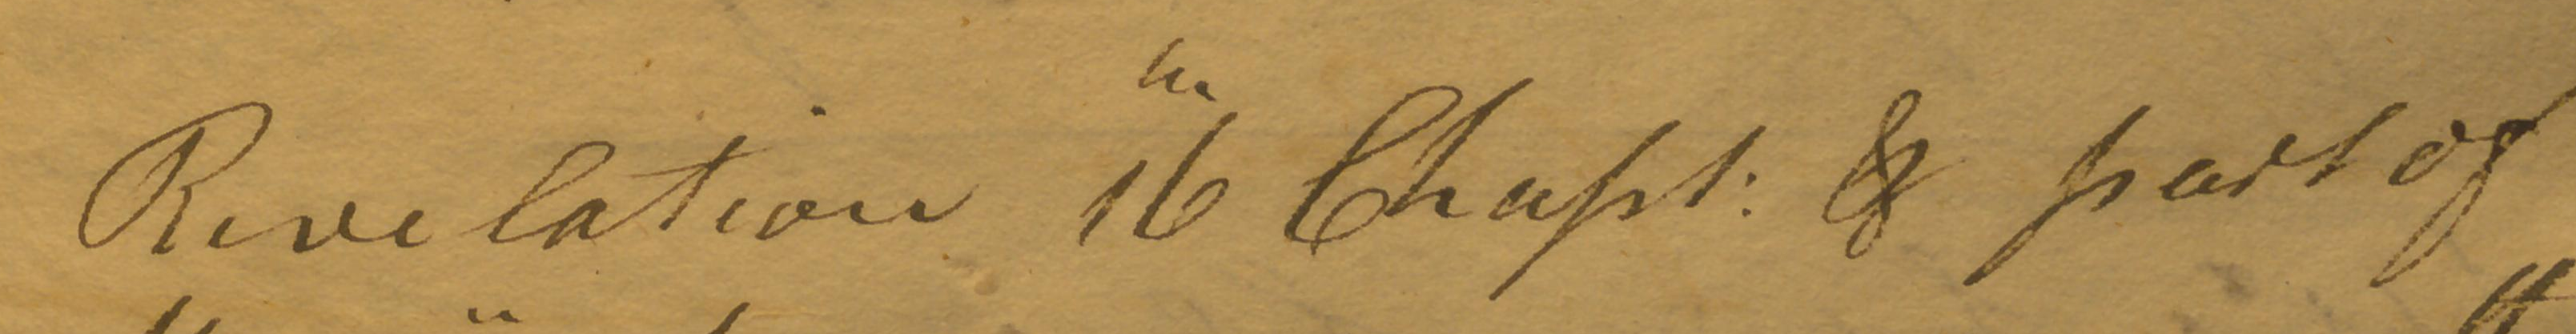Revelation 16^th Chapt: & part of
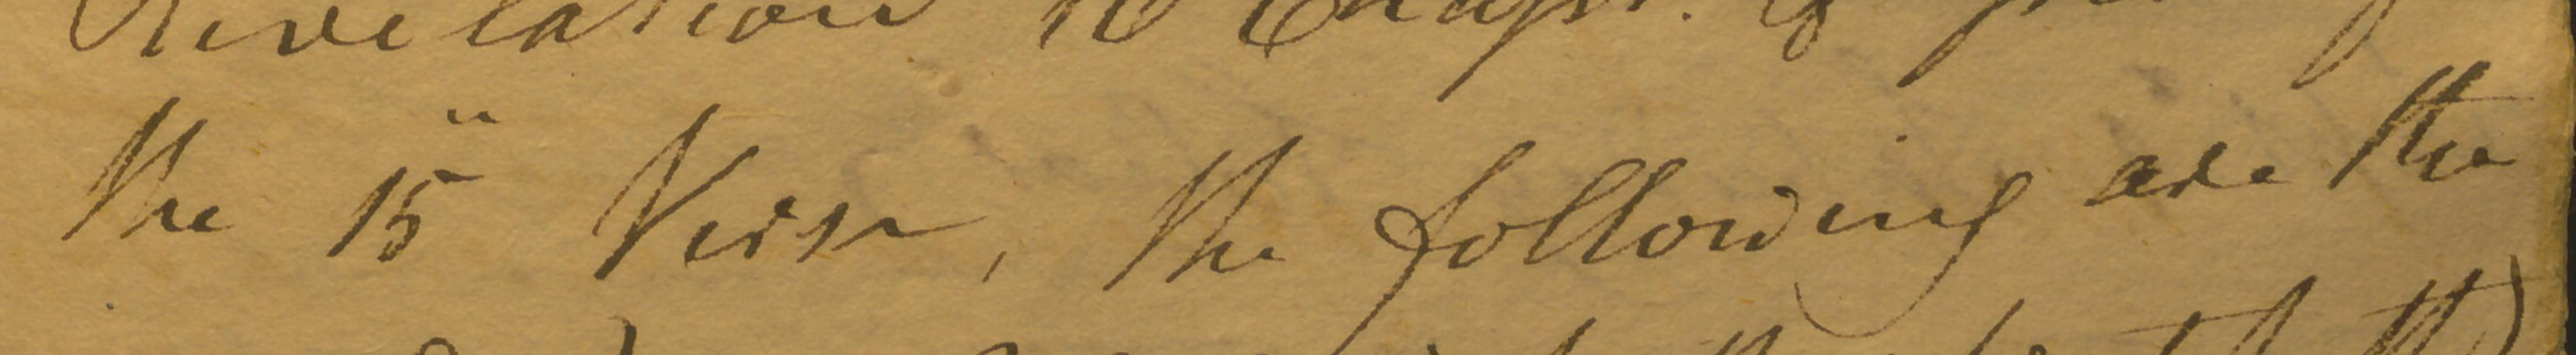The 15^th Verse, the following are the
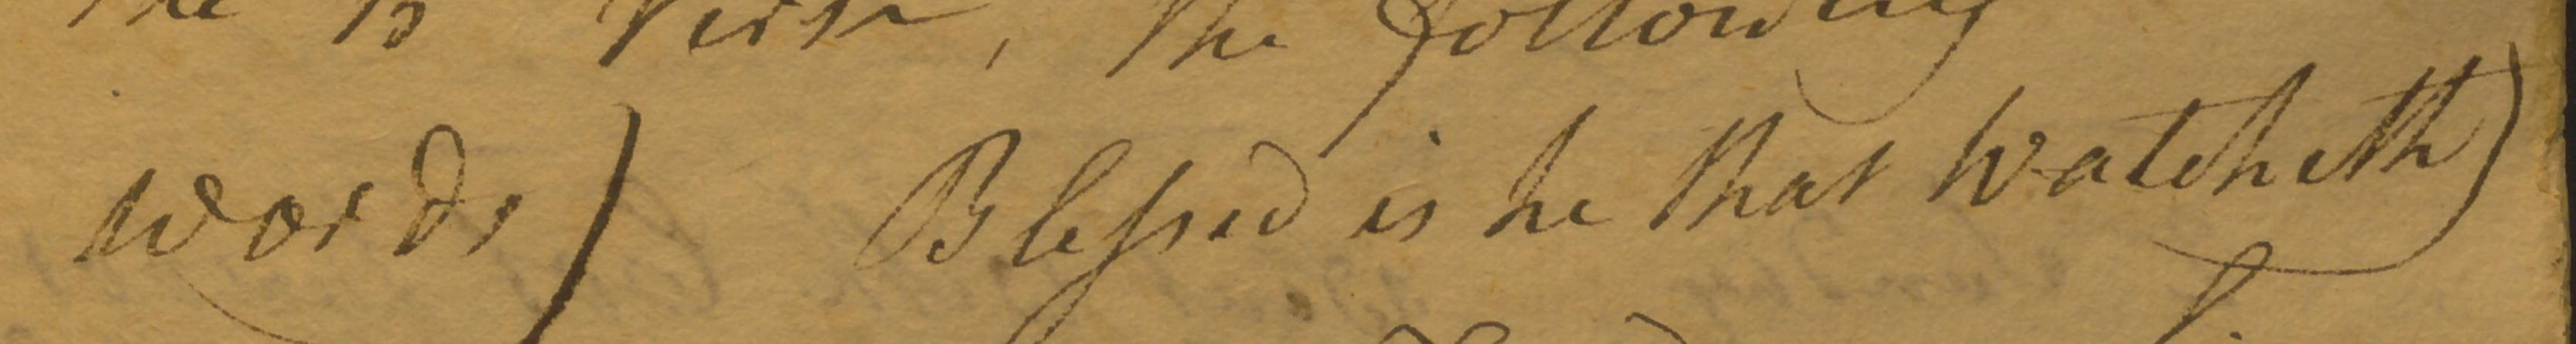words) Blessed is he that watcheth)
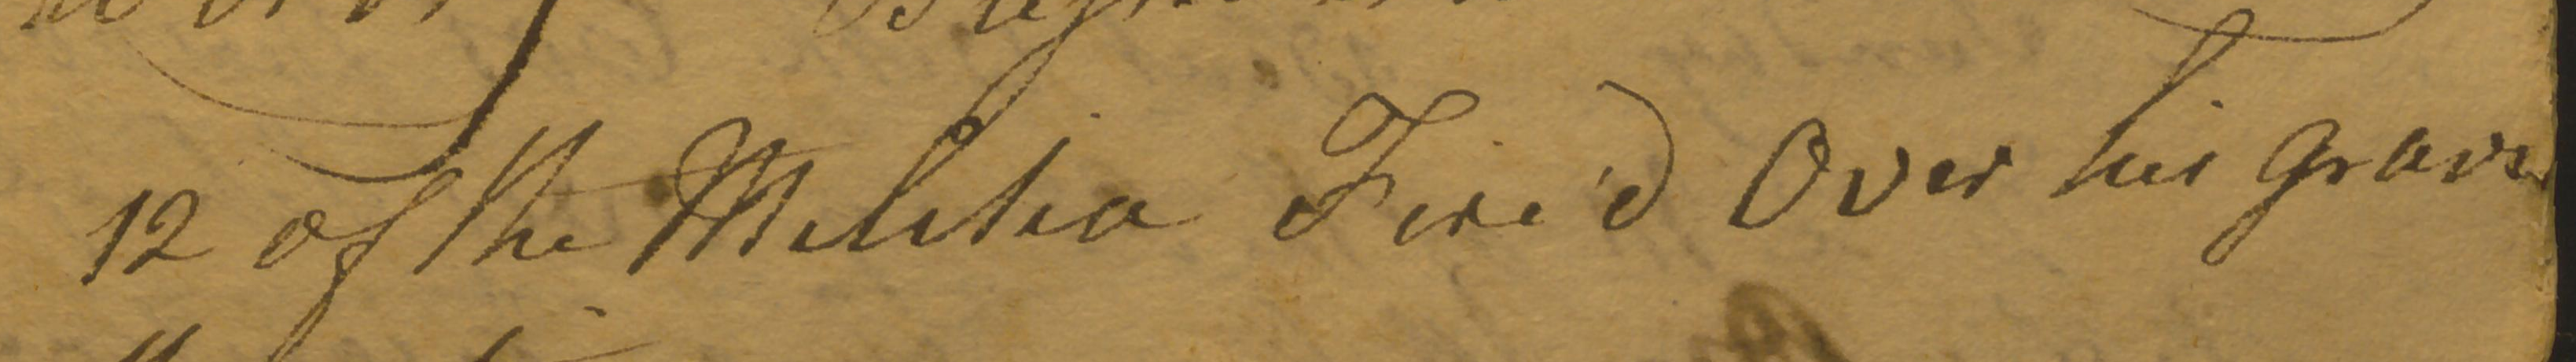12 of the Militia Fire'd over his grave
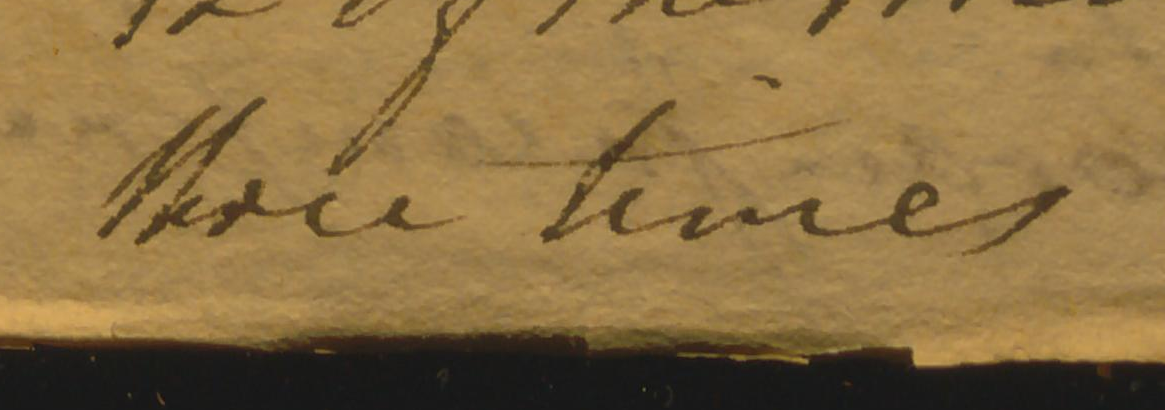three times
